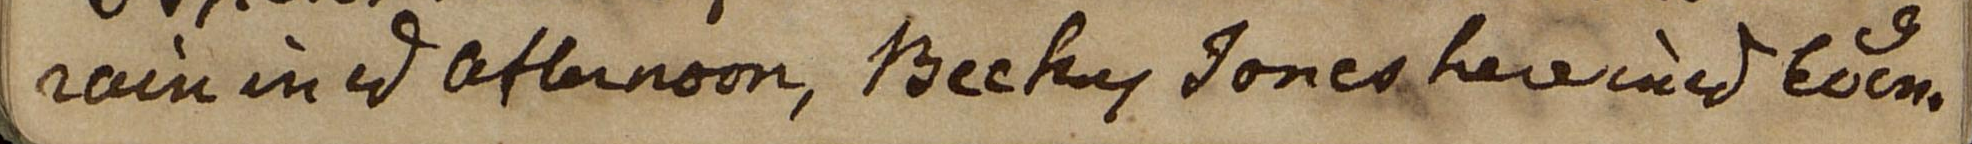rain in y^e Afternoon, Becky Jones here in y^e Even^g.
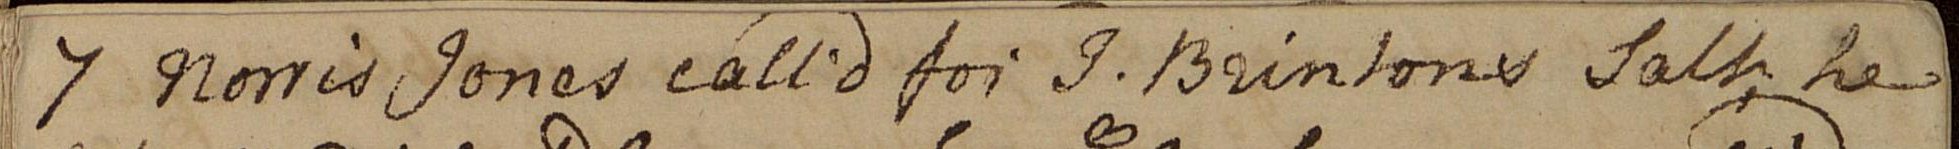7 Norris Jones call'd for J. Brintons Salt, he
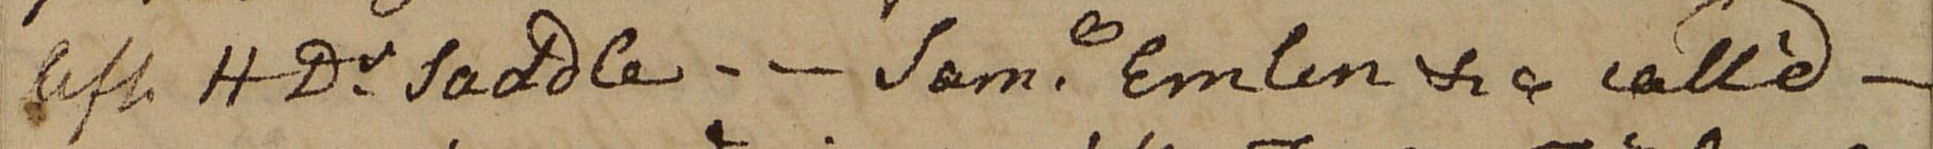left HD^s. Saddle-- Sam^l. Emlen &e call'd-
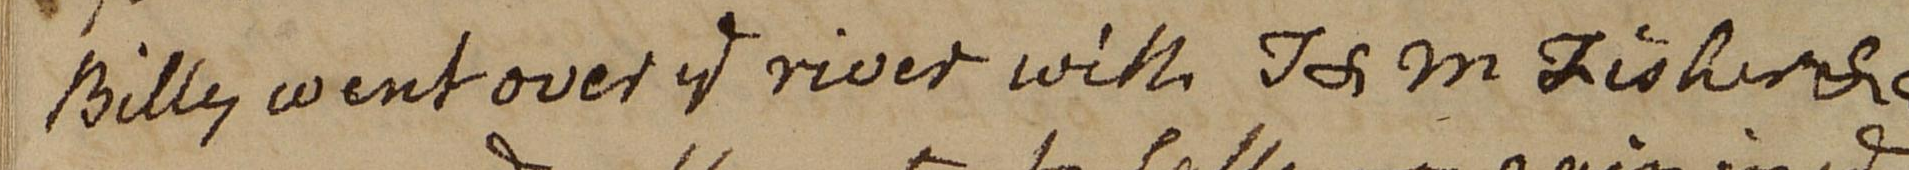Billy went over y^e river with TS M Fisher &c
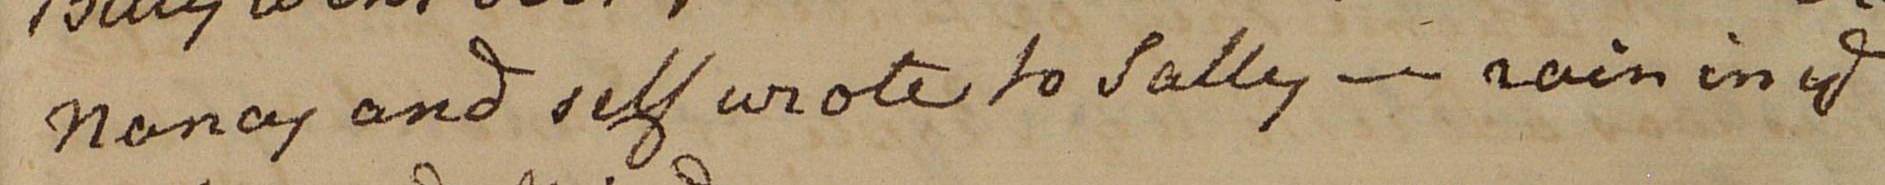Nancy and self wrote to Sally- rain in y^e
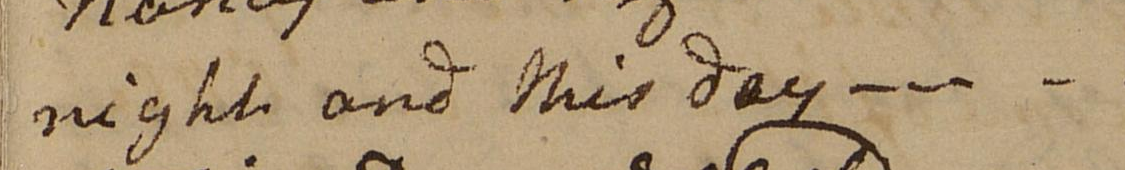night and this day--
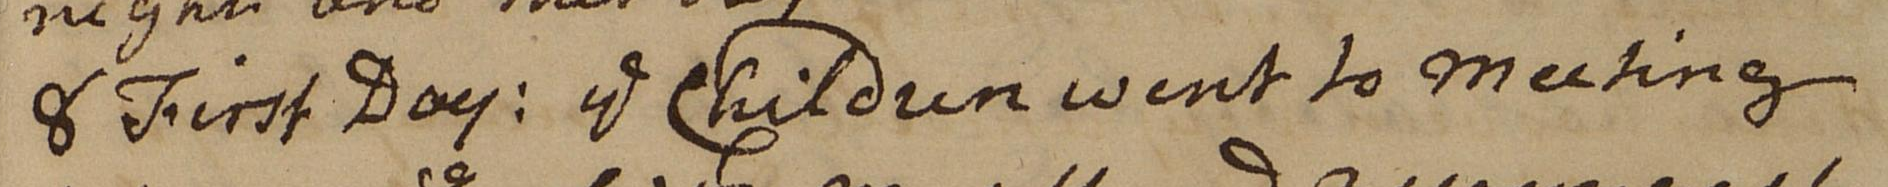8 First Day: y^e Children went to meeting
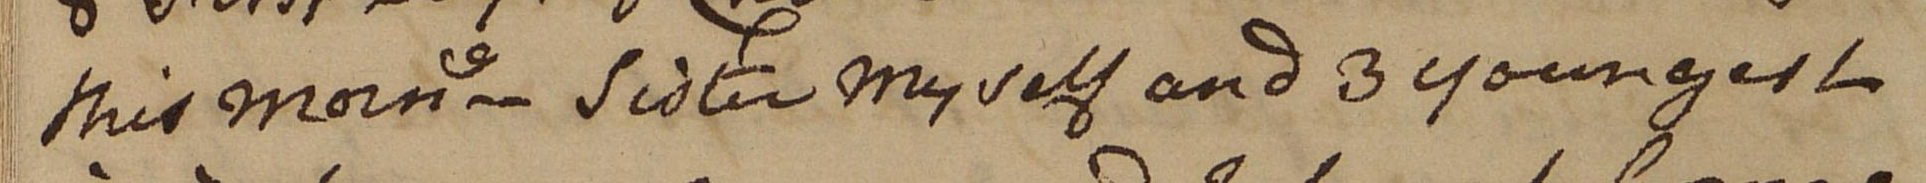this morn^g- Sister my self and 3 youngest
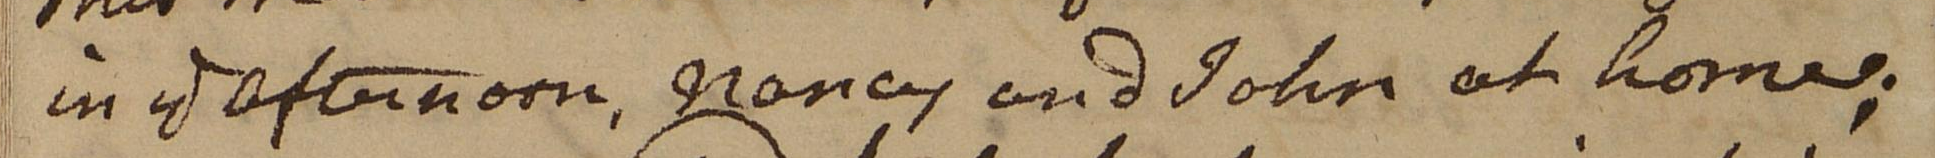in y^e Afternoon, Nancy and John at home;
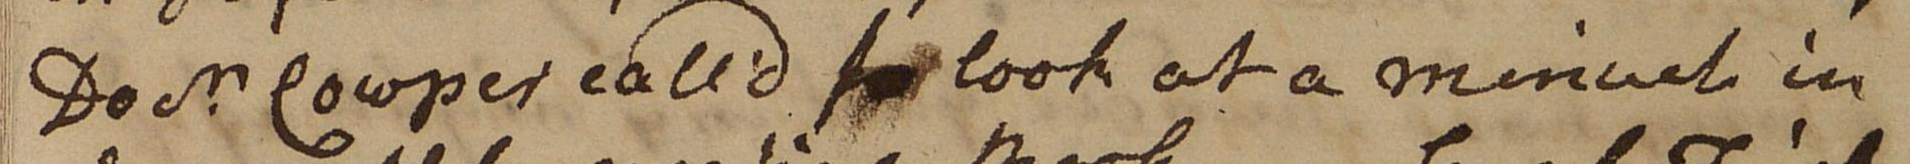Doc^r. Cowper call'd to look at a minuet in
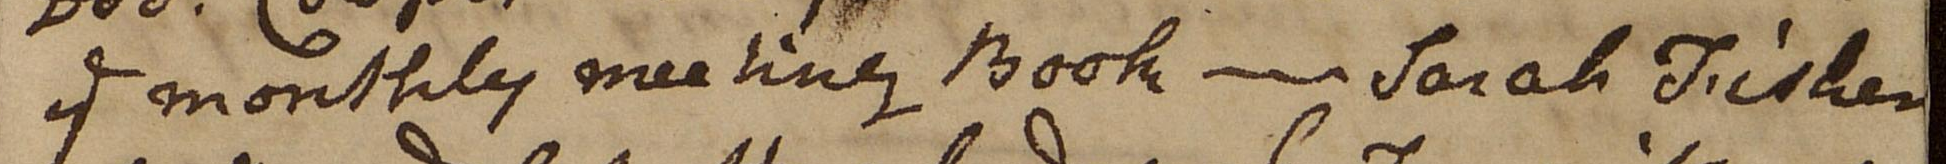y^e monthly meeting Book- Sarah Fisher
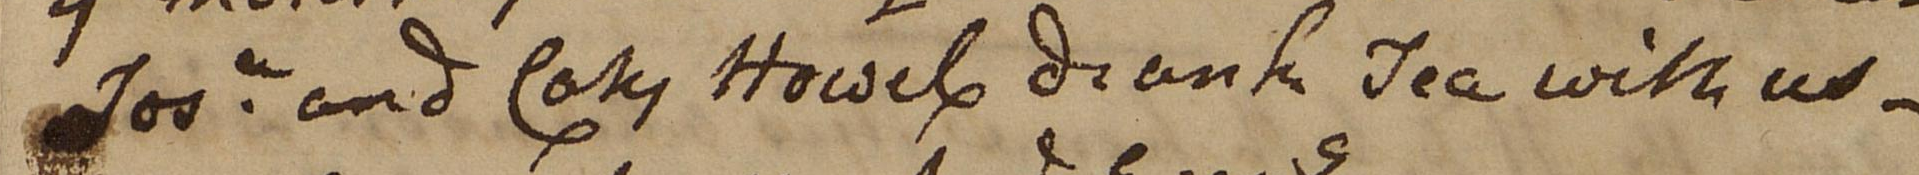Jos^a. and Caty Howel drank Tea with us-
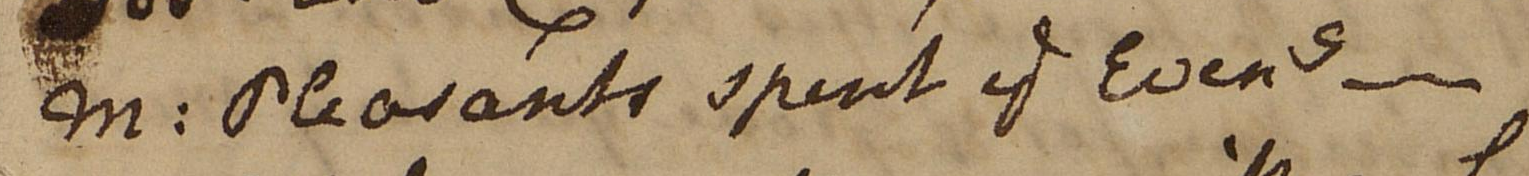M: Pleasants spent y^e Even^g-
